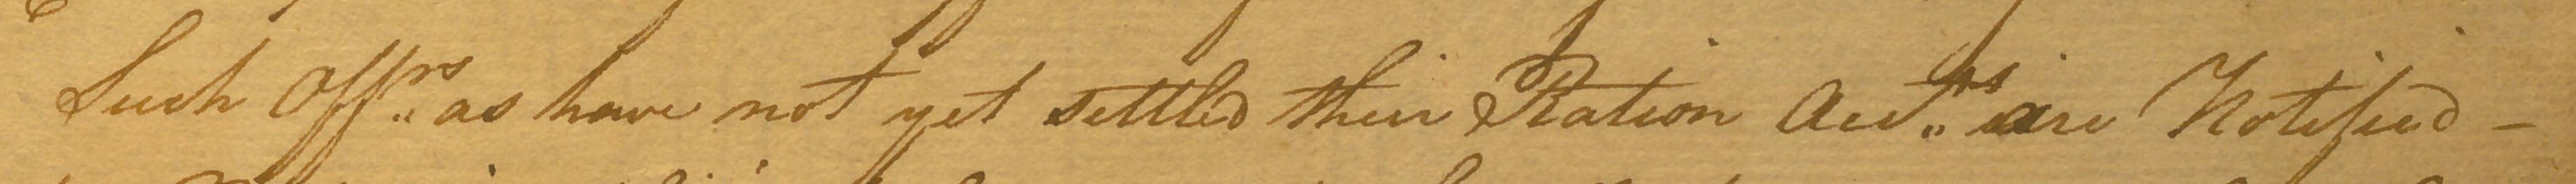Such Off^rs. as have not yet settled their Ration Acc^ts. are Notified-
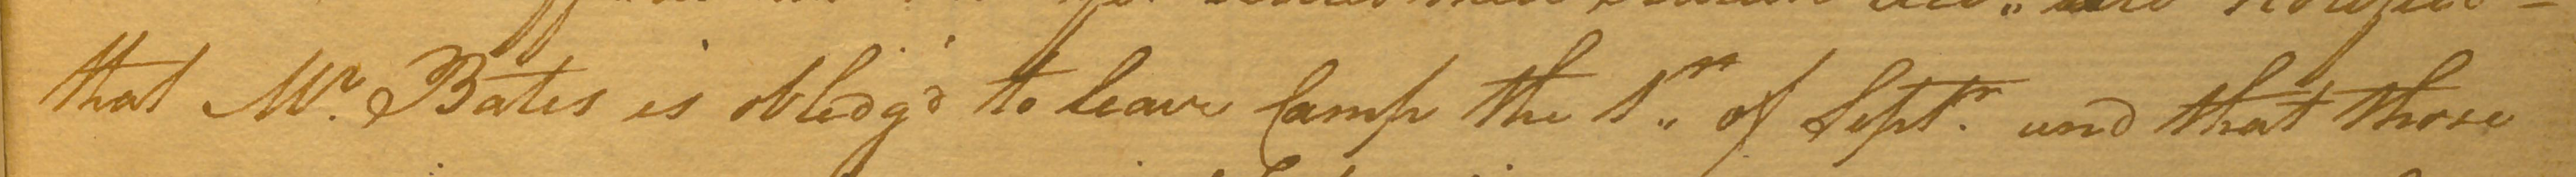that M^r. Bates is oblidg'd to leave Camp the 1^st. of Sept^r. and that those
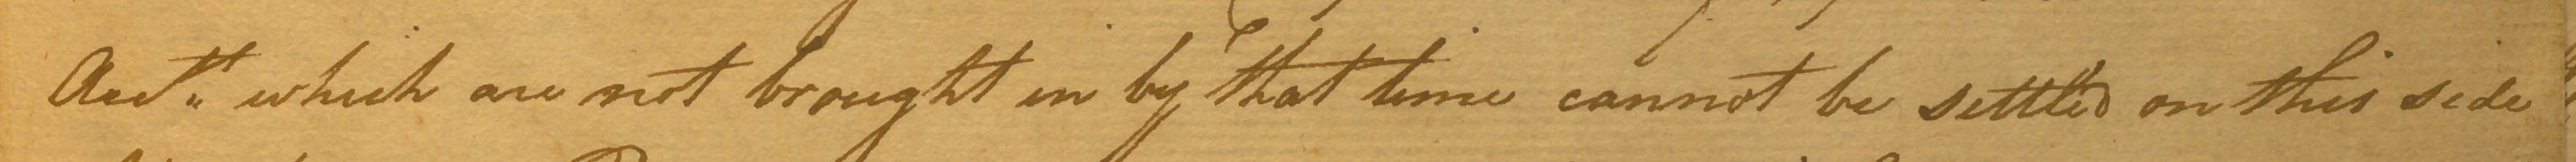Acc^ts. which are not brought in by that time cannot be settl'd on this side
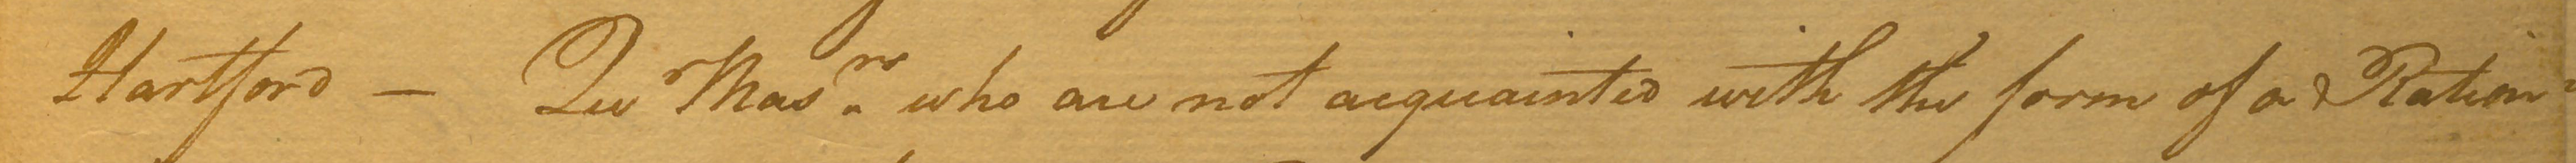Hartford- Qu^r Mas^rs. who are not acquainted with the form of a Return
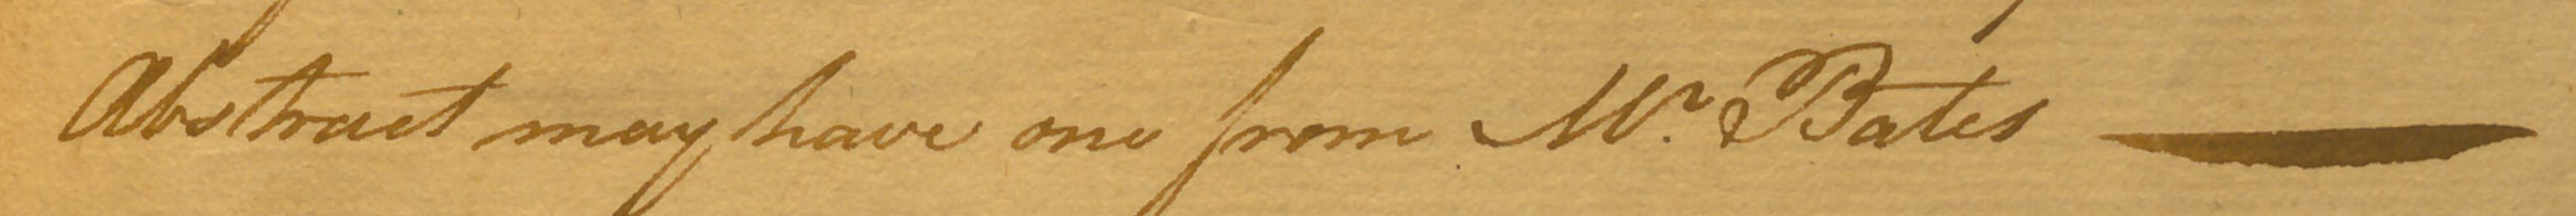Abstract may have one from M^r. Bates-
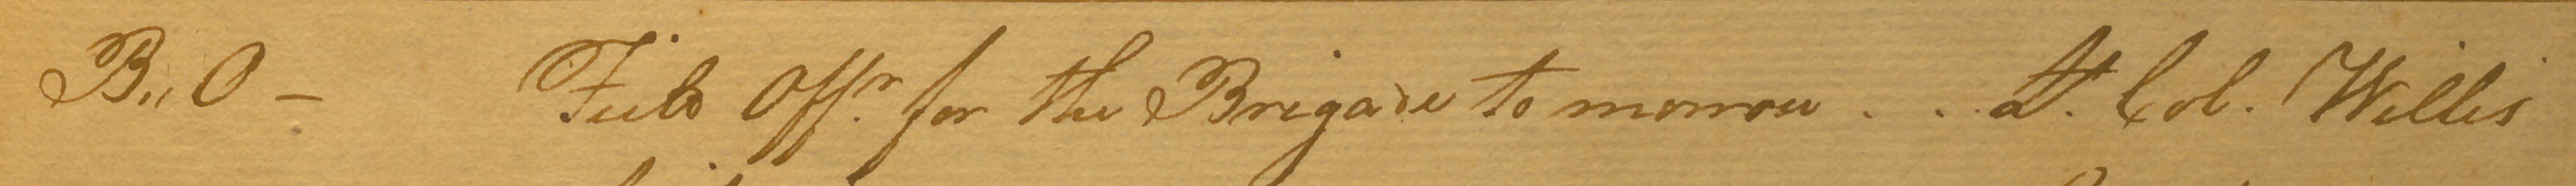B.O- Field Off^r. for the Brigade tomorrow.. L^t. Col. Willis
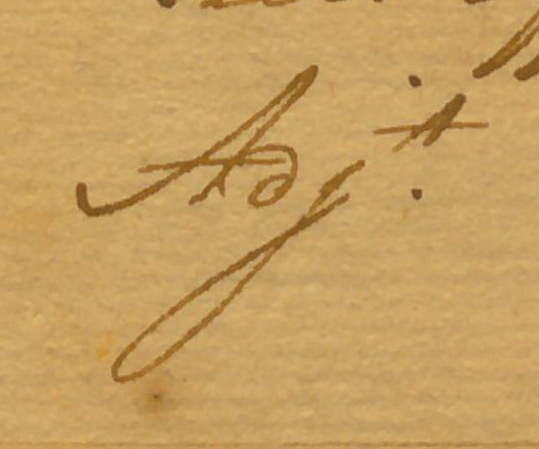Adj^t.
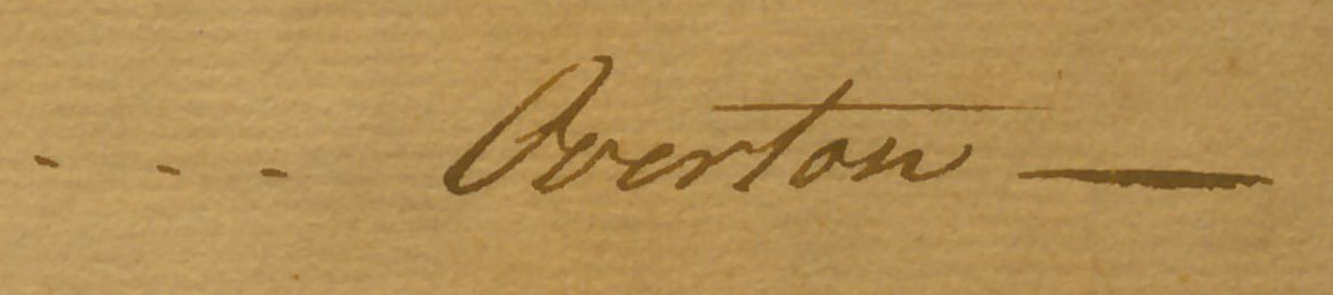... Overton-
